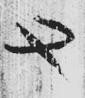又（有）
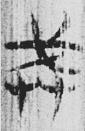戒
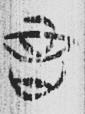言
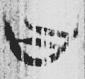曰
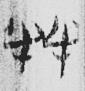牪（奔）
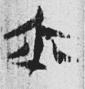尓
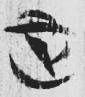正
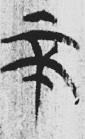不
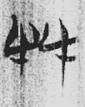牪（奔）
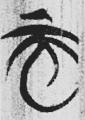而（尓）
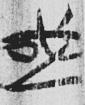或
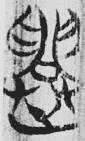○（興）
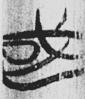或
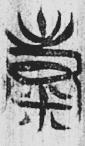康
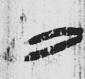㠯
